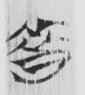昔
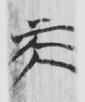天
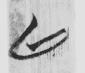㠯（以）
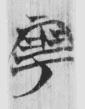𩁹
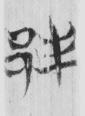邦
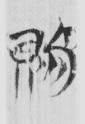賜
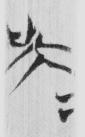吳=
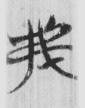弗
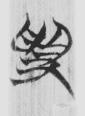受
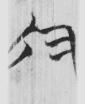今
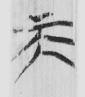天
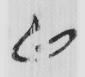㠯（以）
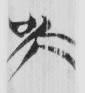吳
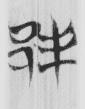邦
